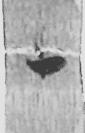十
